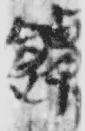饋
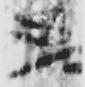之
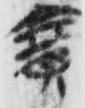賽
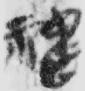禱
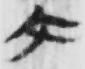文
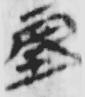坪（平）
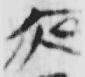○（夜）
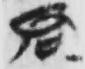君
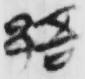郚
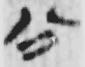公
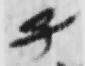子
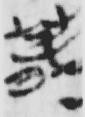○（春）
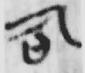司
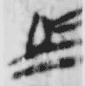馬
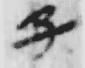子
